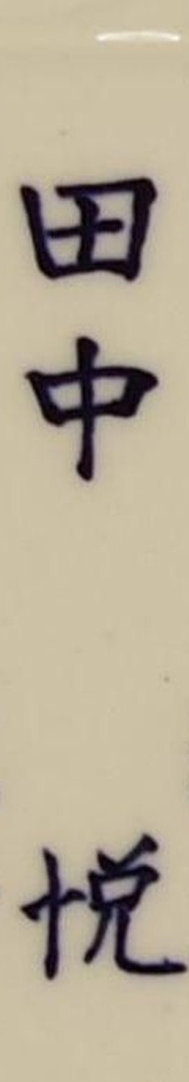田中悦
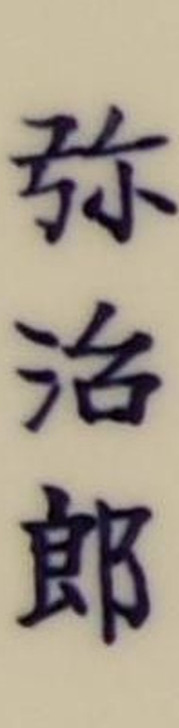弥治郎
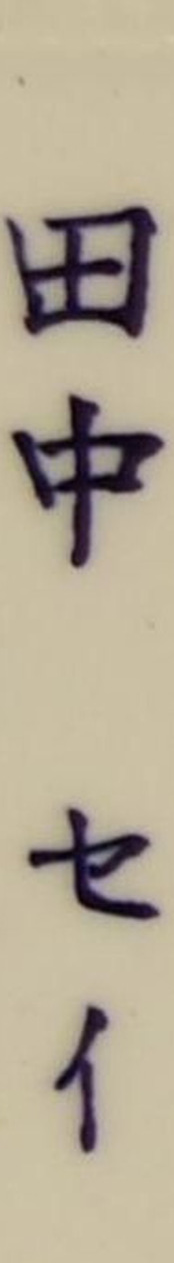田中セイ
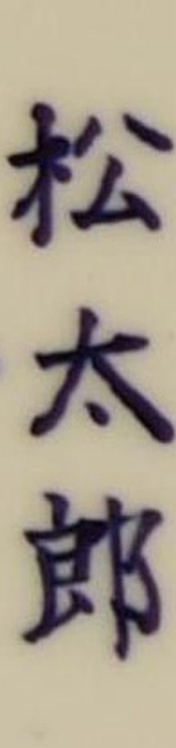松太郎
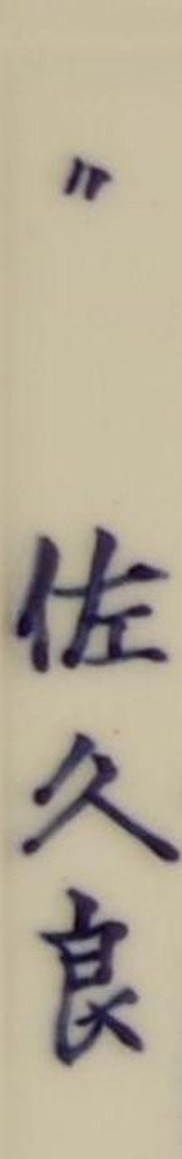佐久良
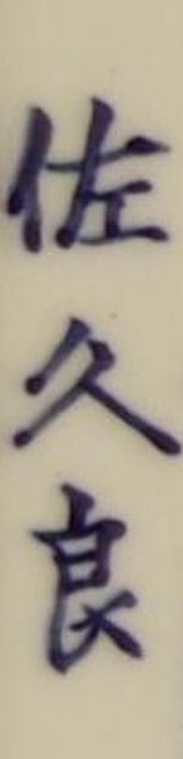佐久良

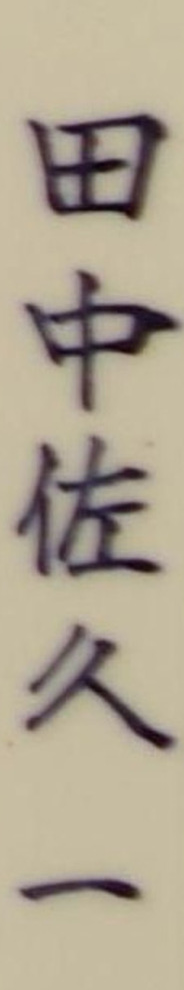田中佐久一
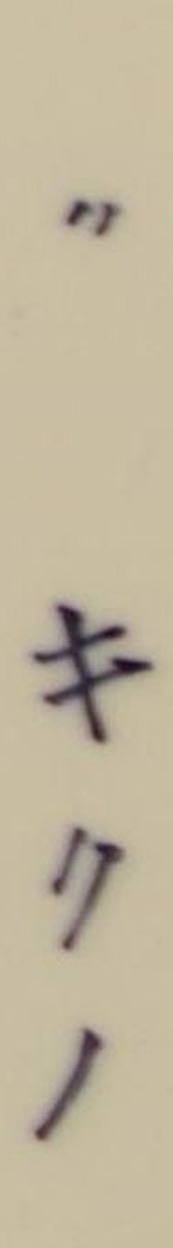キクノ
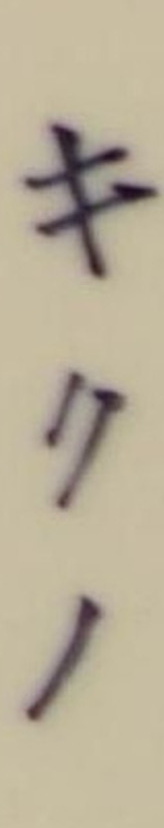キクノ
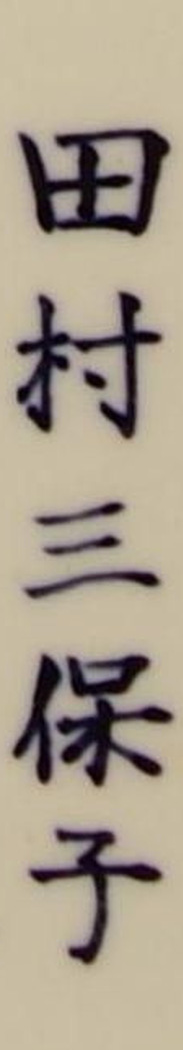田村三保子
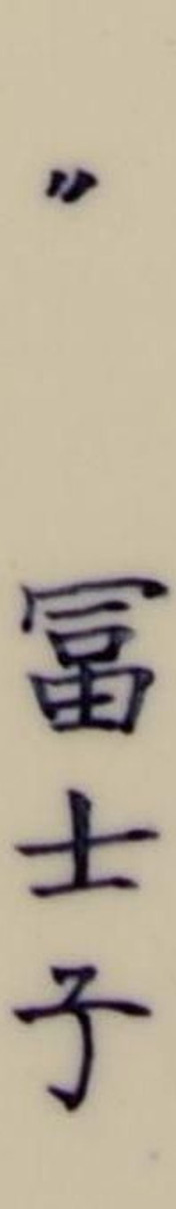冨士子
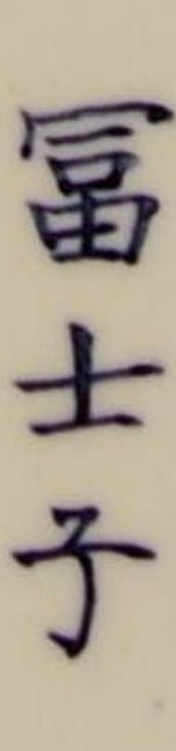冨士子
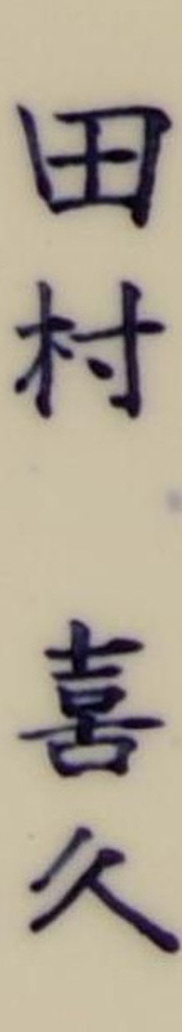田村喜久

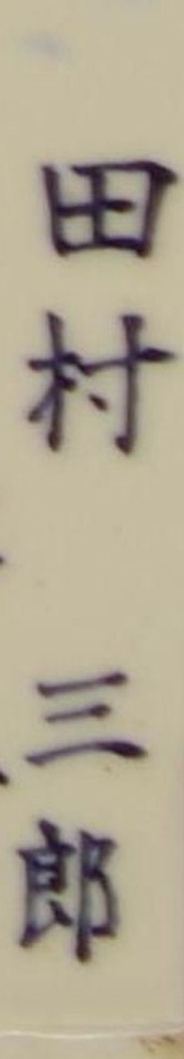田村三郎
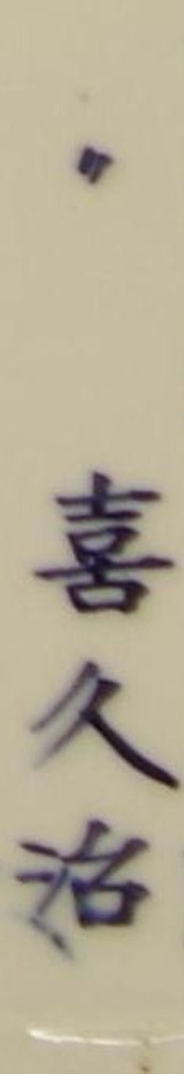喜久治
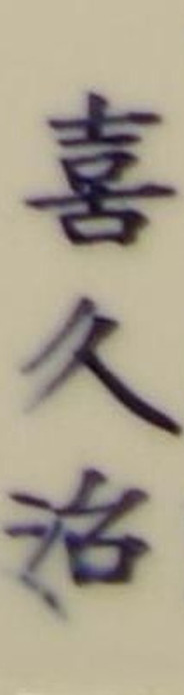喜久治
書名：A~D
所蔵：koyasan kongobuji
